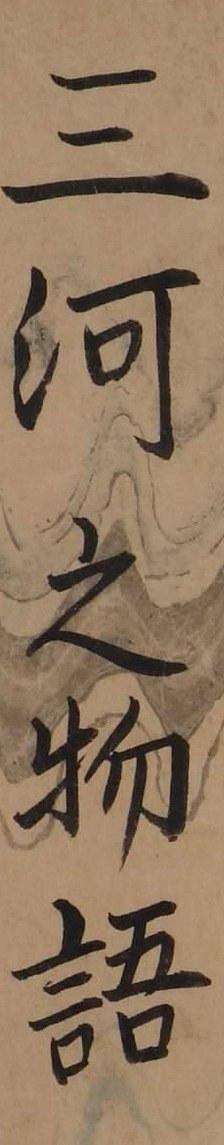三河之物語

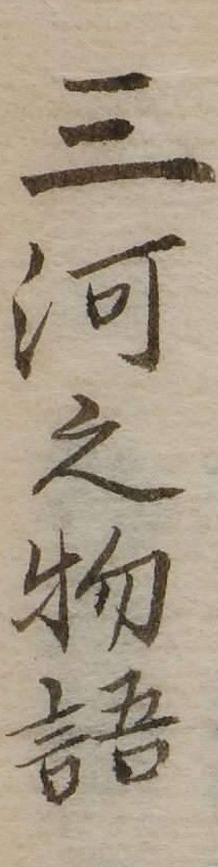三河之物語

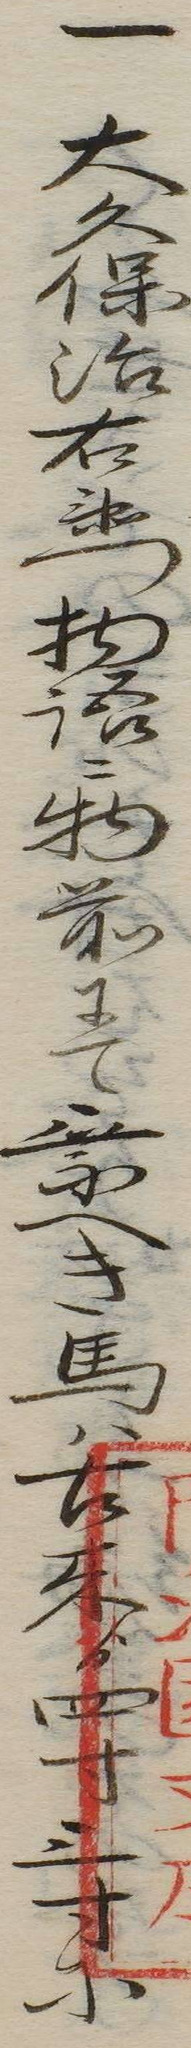一大久保治右衛門物語ニ物前にて乗へき馬ハ古来ゟ四寸三寸に
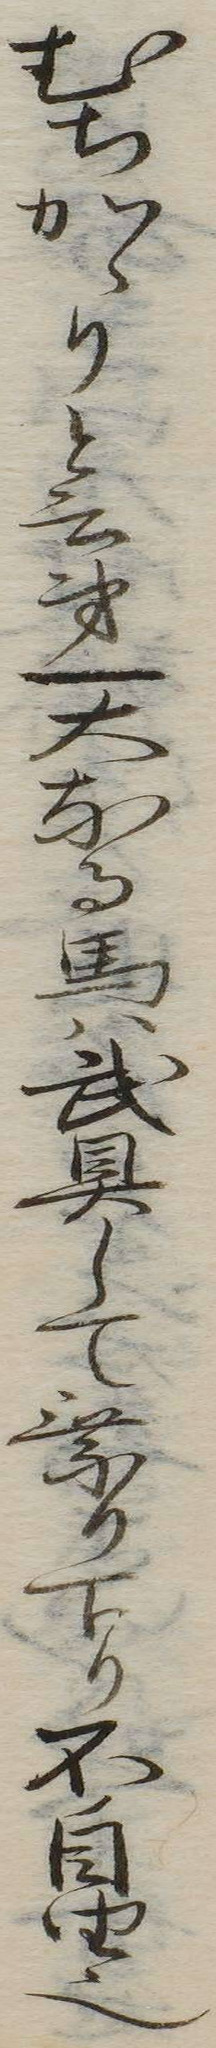むちかゝりと云第一大なる馬ハ武具して乗り下り不自由也
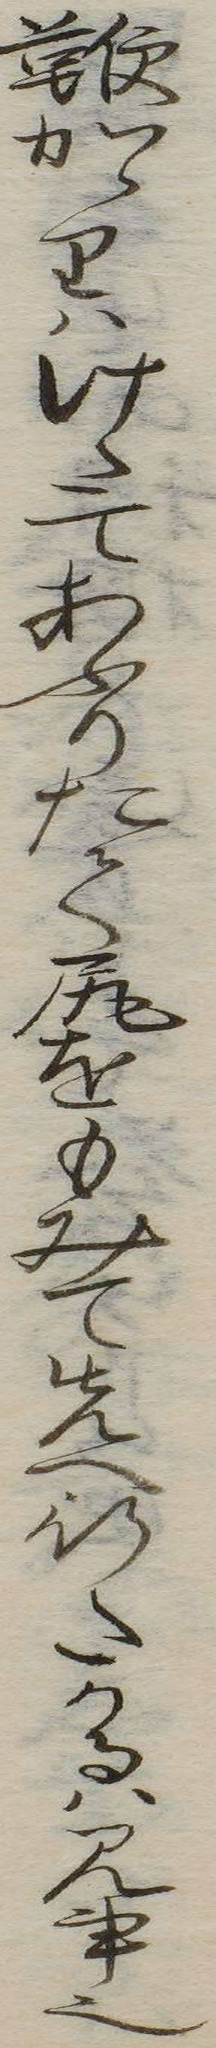鞭かゝりハけたてあふりたて尻をもみて先へ行たかるハ見事也
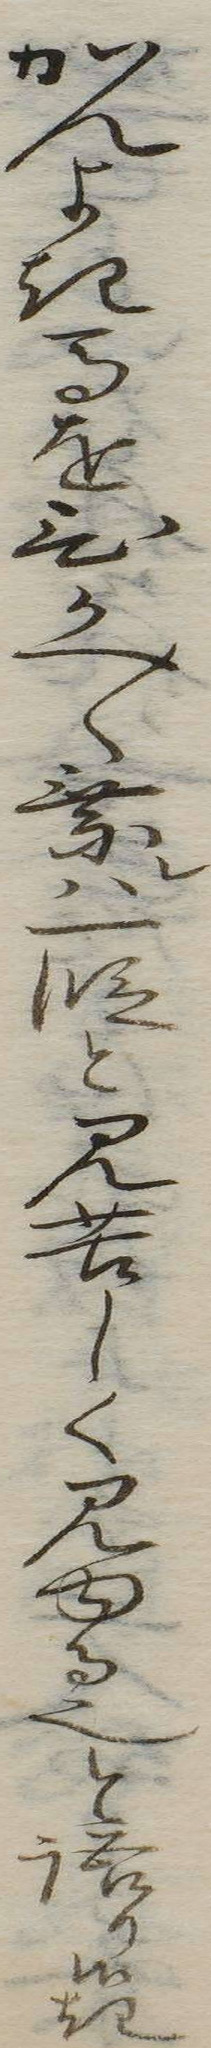かんよき馬ひかへ〳〵乗レハ一段と見苦しく見ゆる也と語り候き
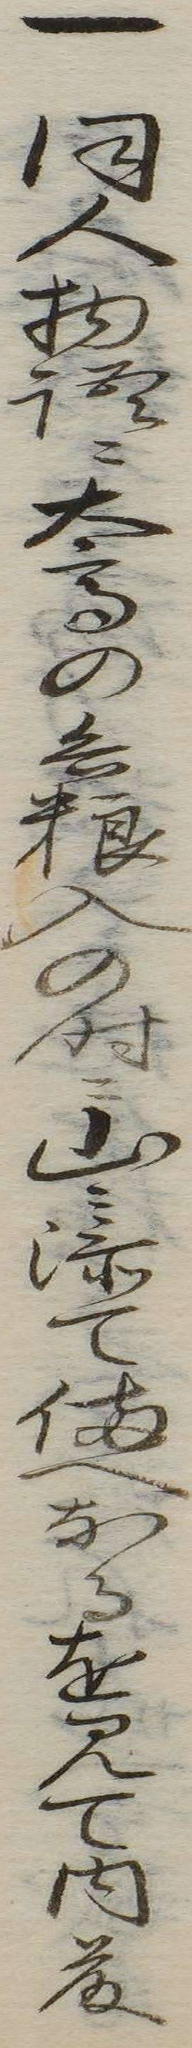一同人物語ニ大高の兵粮入の時ニ山々添て備へなるを見て内藤
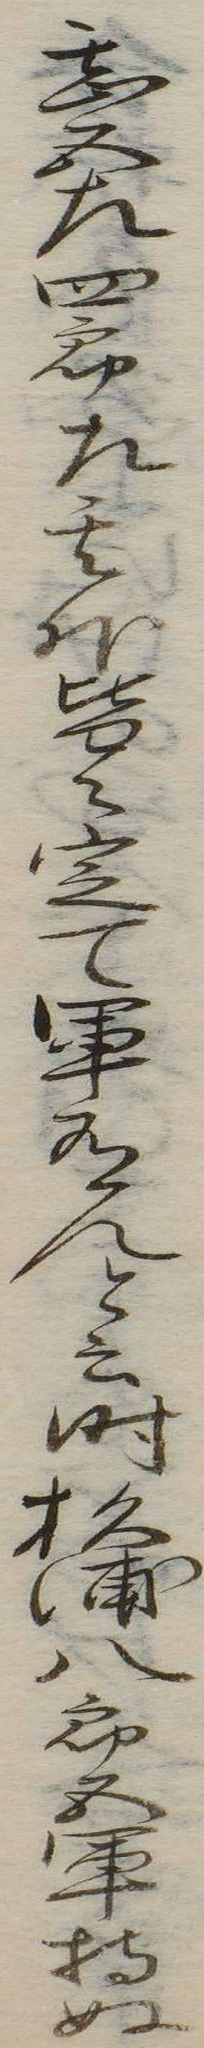甚五左四郎左其外皆々定て軍有んと云時杉浦八郎五軍持ぬ
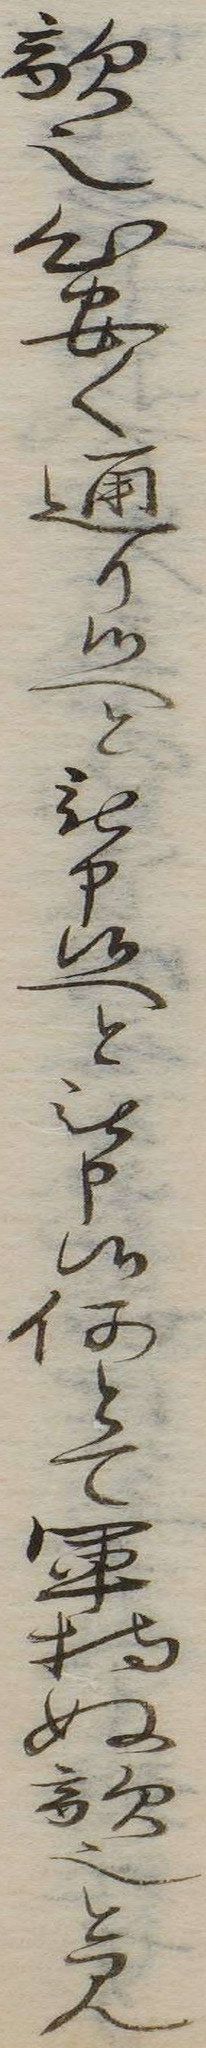敵也心安く通り候へと被申候へと被申候何とて軍持ぬ敵也と見
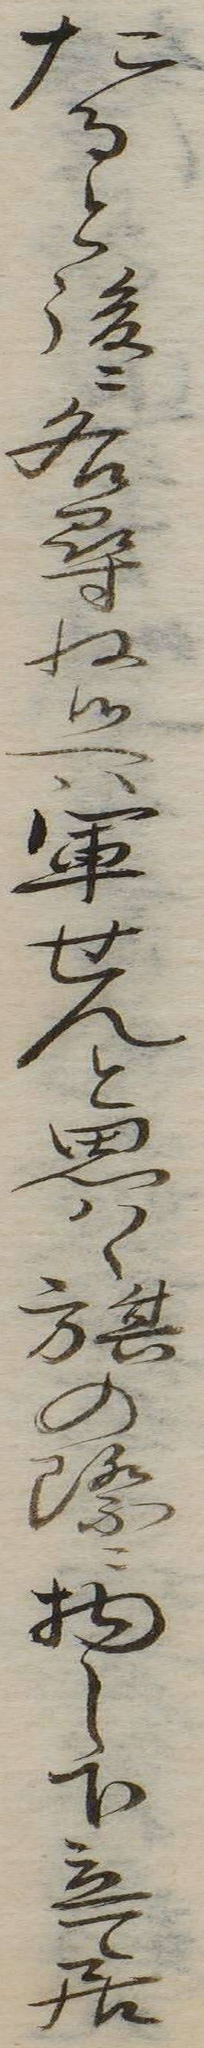たると後ニ各尋ね候へハ軍せんと思ハ丶旗の際ニ物し下立て居
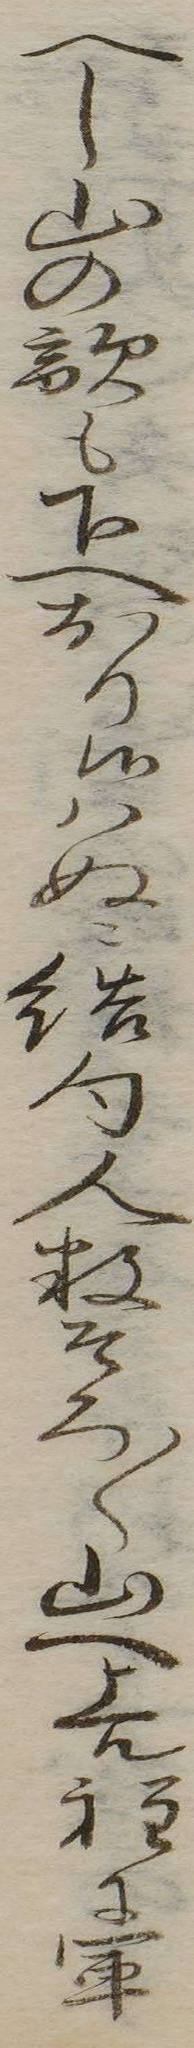へし山の敵も下へおり候ハぬニ結句人数そろ〳〵山へ上ル程に軍
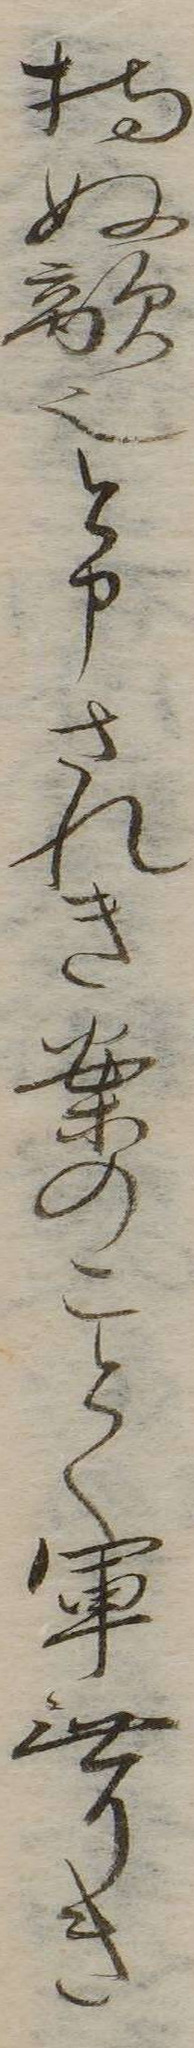持ぬ敵也と申されき案のことく軍無りき

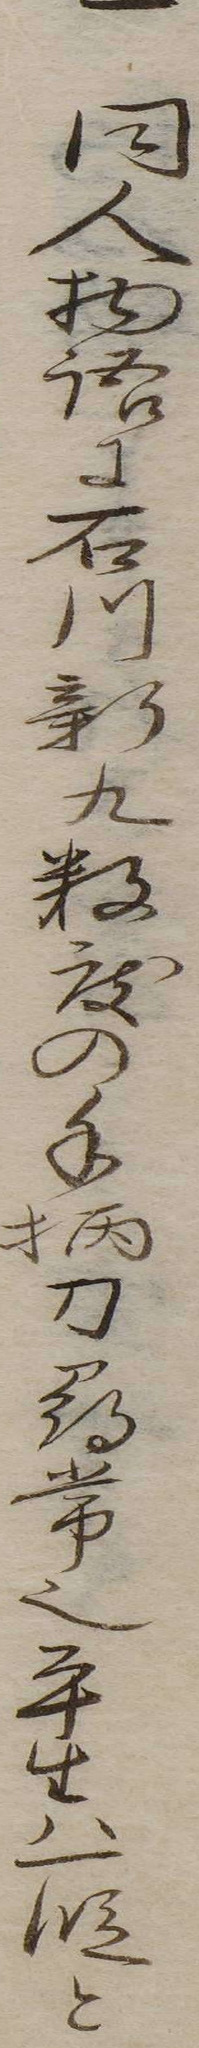一同人物語に石川新九数度の手柄刀尋常也平生ハ一段と
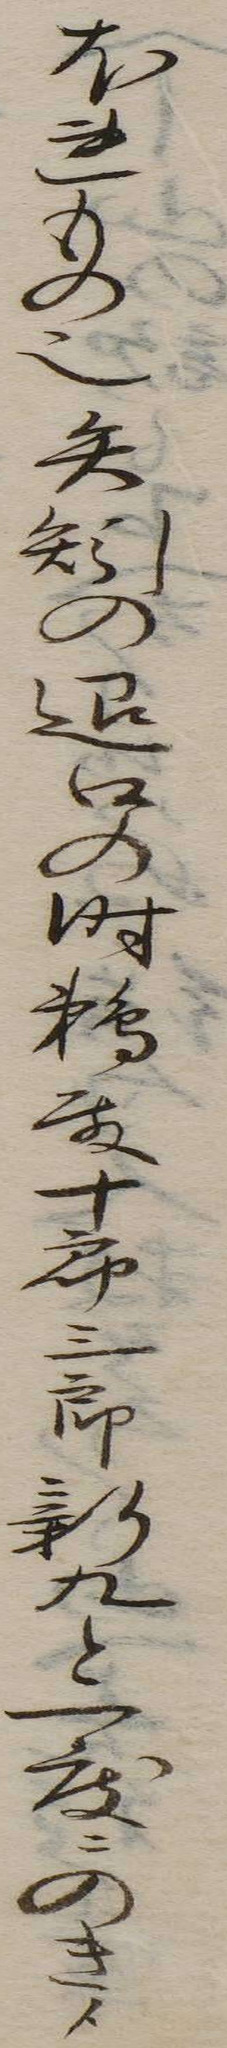ほれもの也矢矧の退口の時鵜殿十郎三郎新九と一度ニのき候
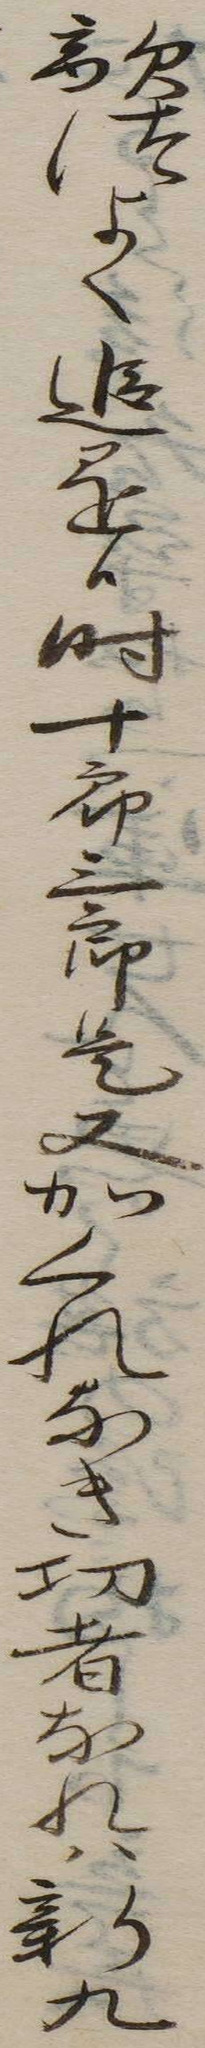敵つよく追懸候時十郎三郎是又かくれなき功者なれハ新九
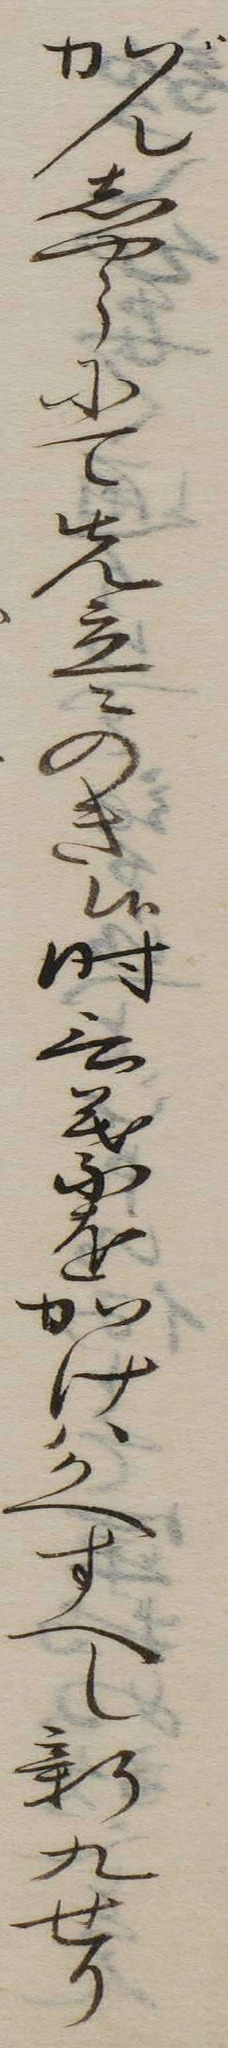がんしやうにて先立ニのき候時言葉をかけハかへすへし新九せり
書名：三河之物語
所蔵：国文学研究資料館
